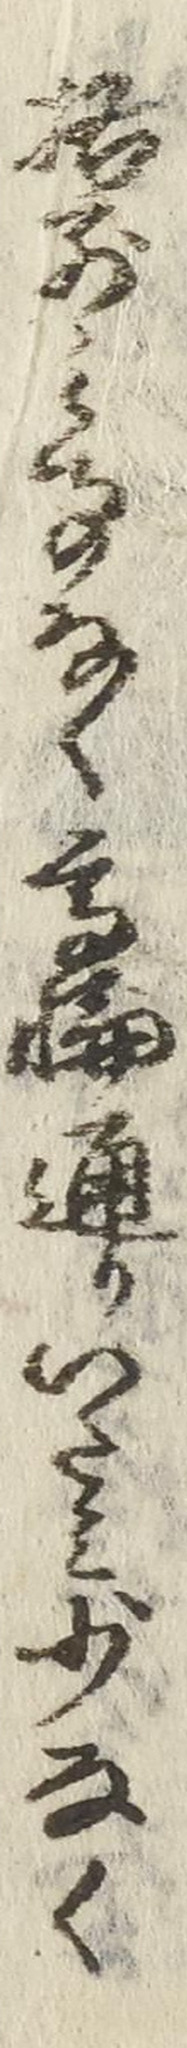格別之事なく高輪通りいたみ少なく
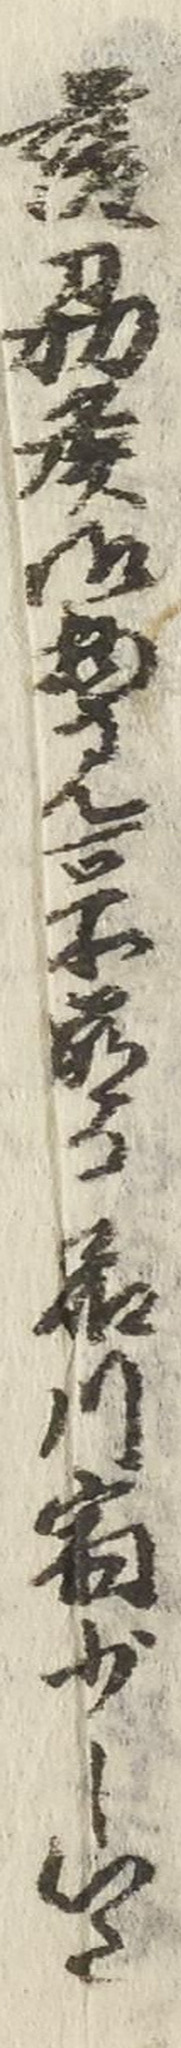薩洲矦御物見一ヶ所崩る品川宿少しいた
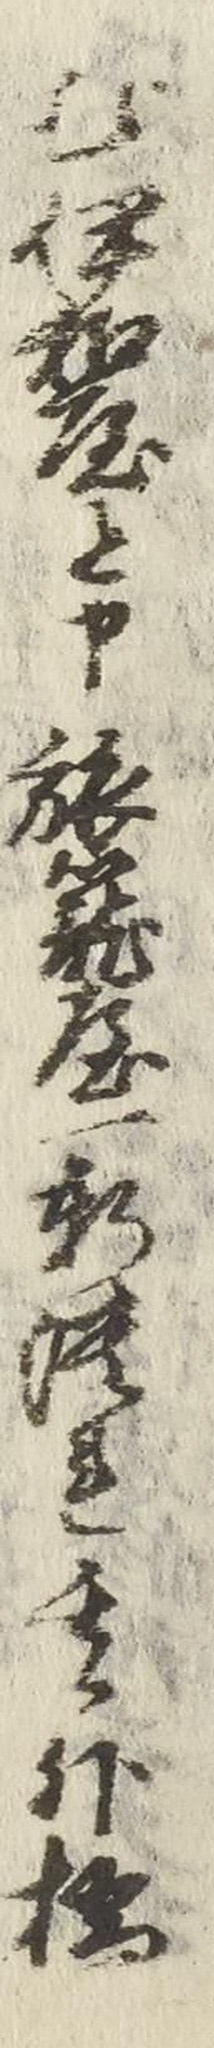む伊和屋と申旅籠屋一軒潰れ其外橋
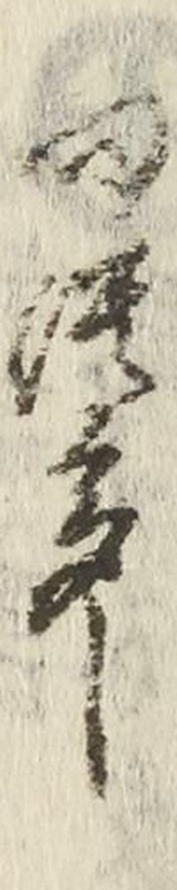向潰多し
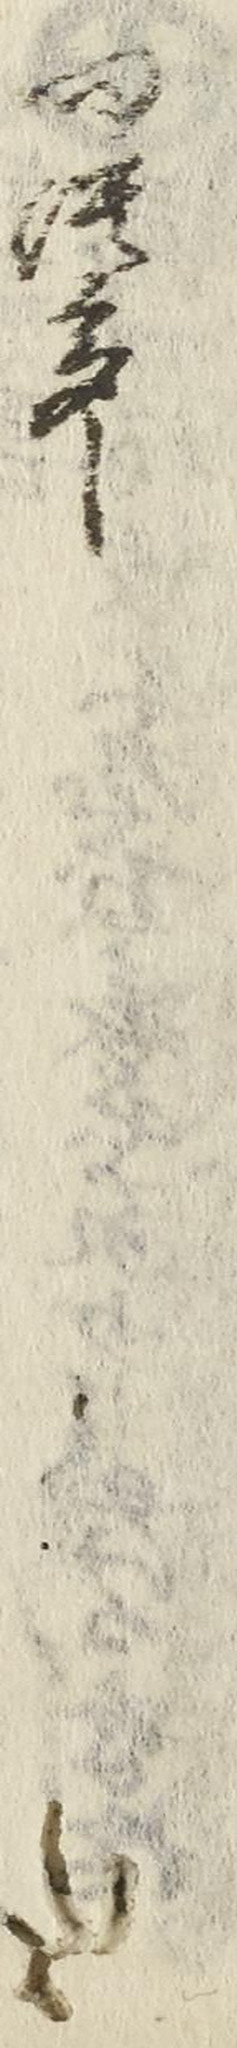向潰多し
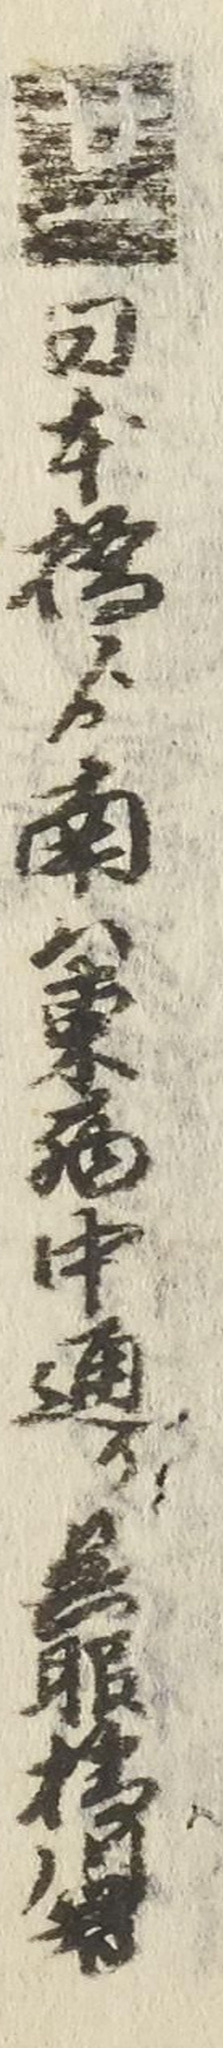廿一日本橋ゟ南は東西中通り呉服橋川岸
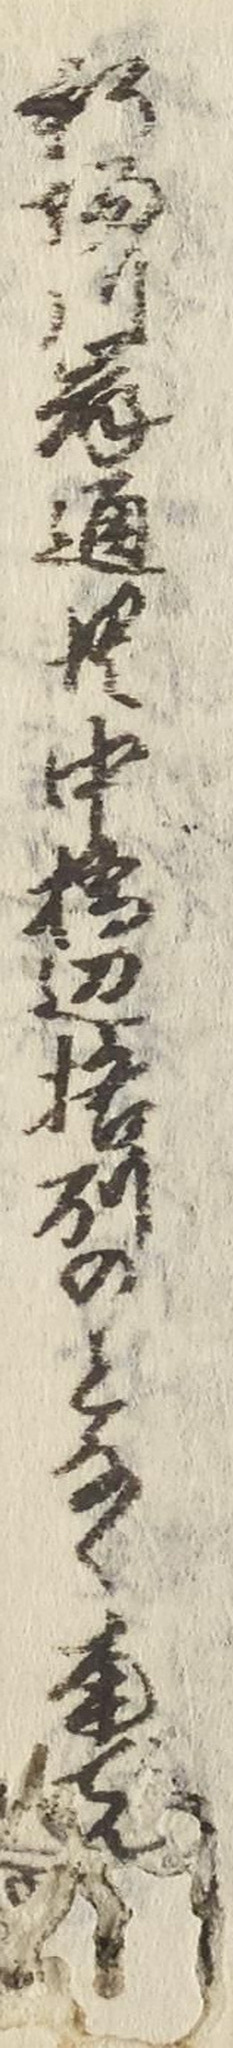新場河岸通り中橋辺格別のことなく本伝馬
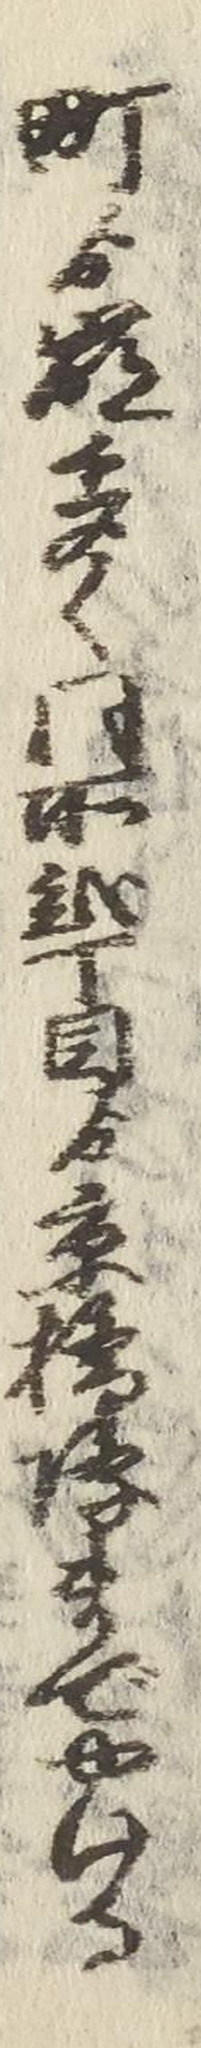町ゟ崩多く同所弐丁目ゟ京橋際迄やける
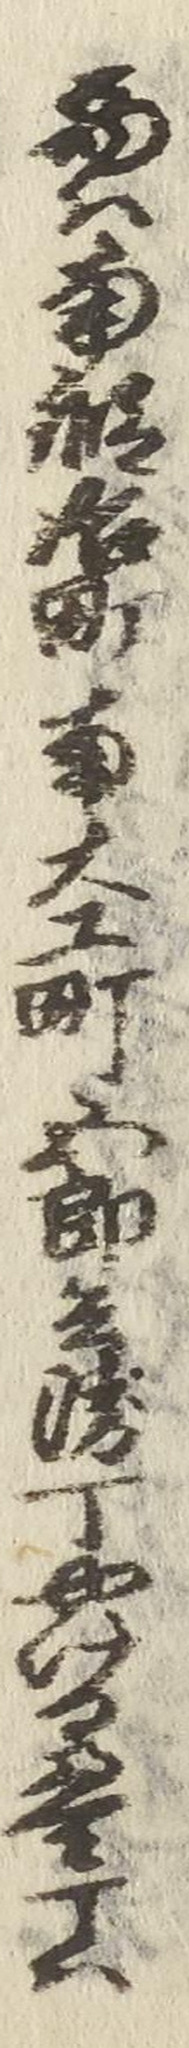西は南鍛冶町南大工町五郎兵衛丁やける畳丁は
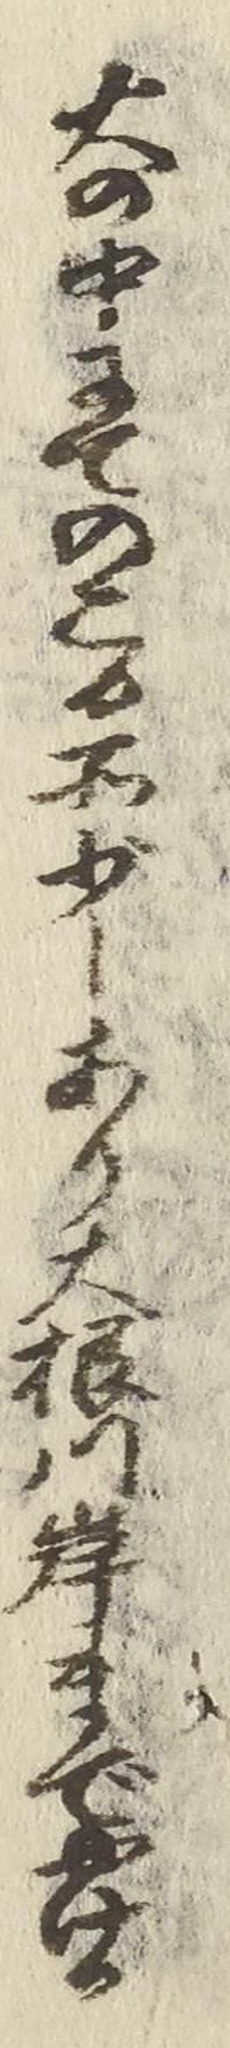火の中にてのこる所少しあり大根川岸までやける
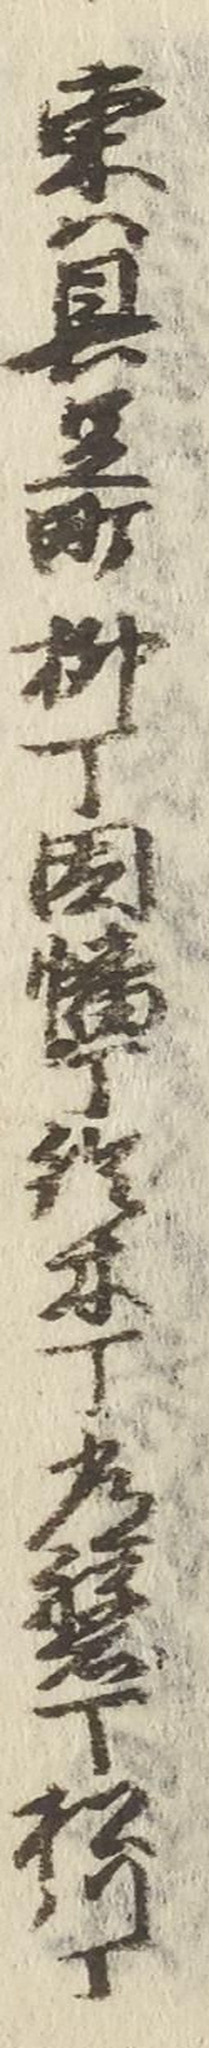東は具足町柳丁因幡丁鈴木町常盤丁松川丁
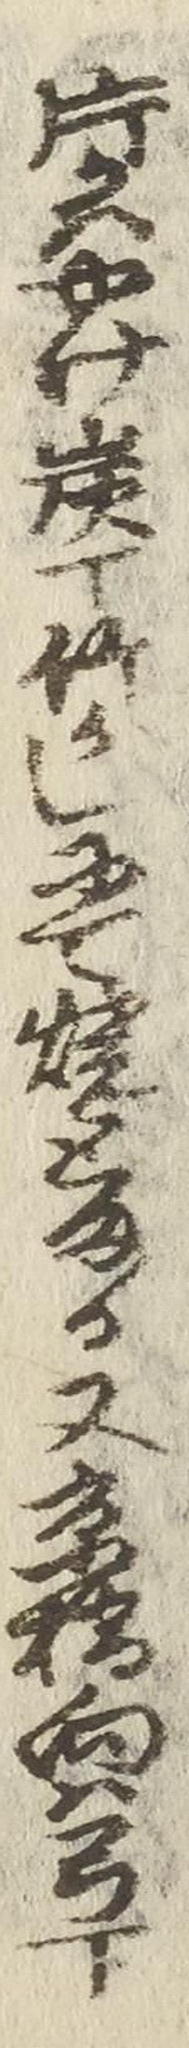片かはやけ炭丁竹かしにて焼とまる又京橋向は弓丁
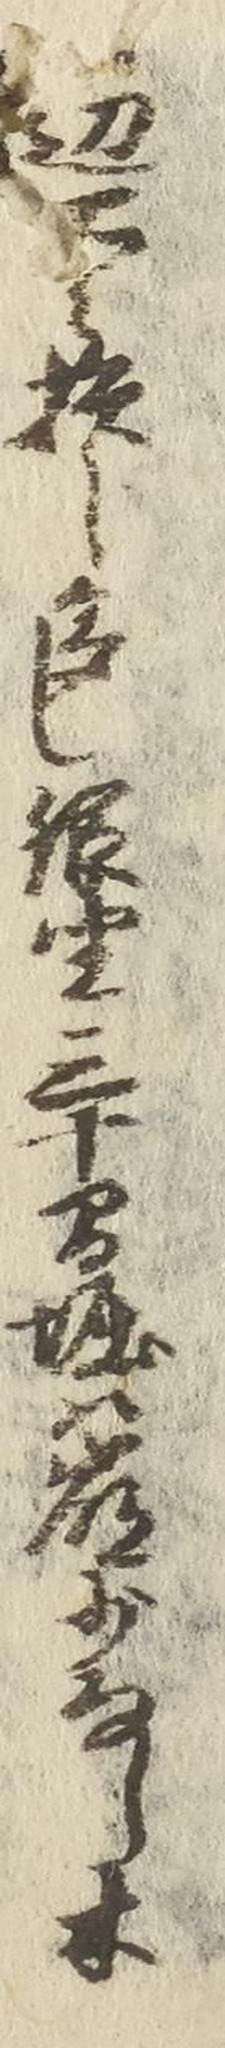辺所々損し多し銀坐三十間堀は崩少なし木
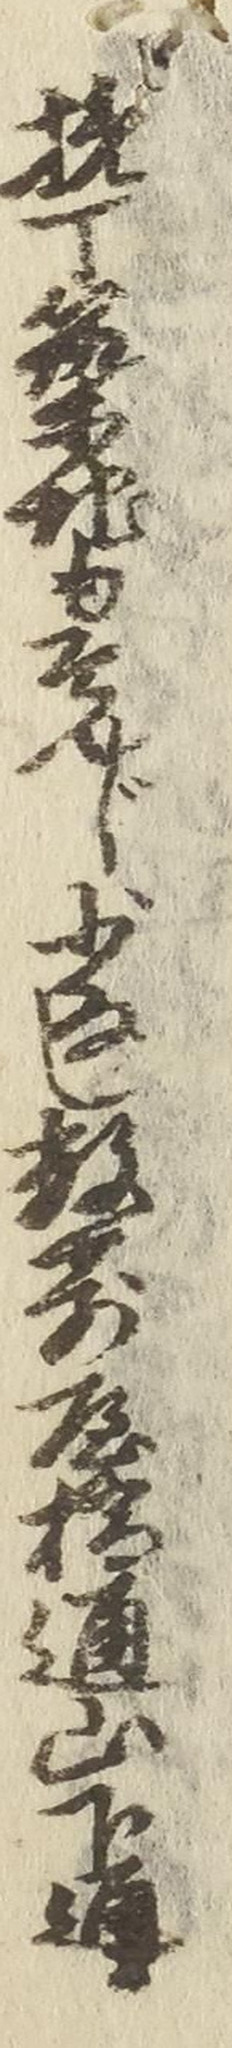挽丁築地もそんじ少なし数寄屋橋通山下通り

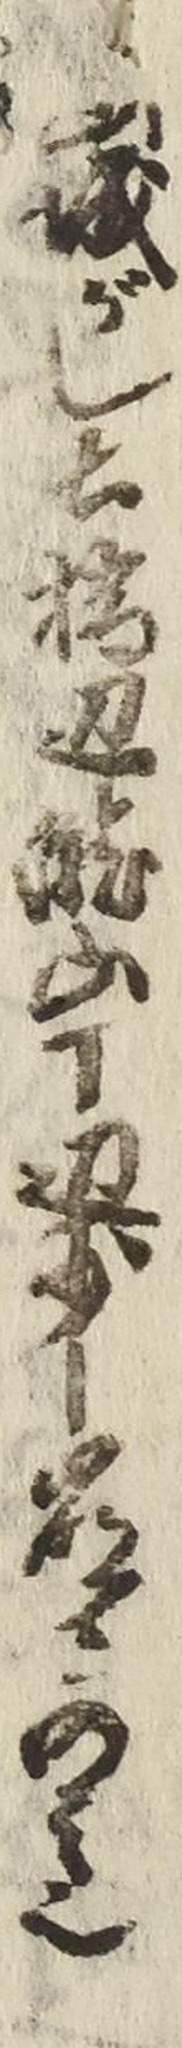山城がし土橋瀧山丁辺少し崩るゝのみ也
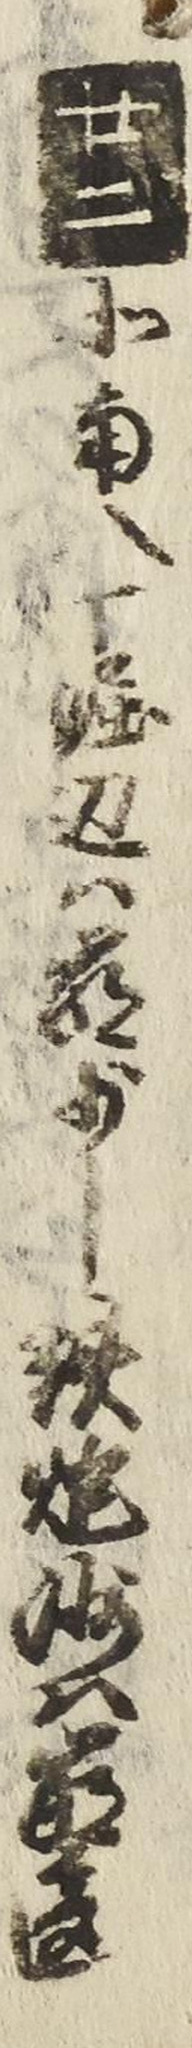廿二北南八丁堀辺ハ崩少し鉄炮洲は崩れ多し
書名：地震出火　男女死人怪我人書上之寫
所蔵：東京大学地震研究所図書室 Earthquake Research Institute Library, The University of Tokyo, JAPAN
